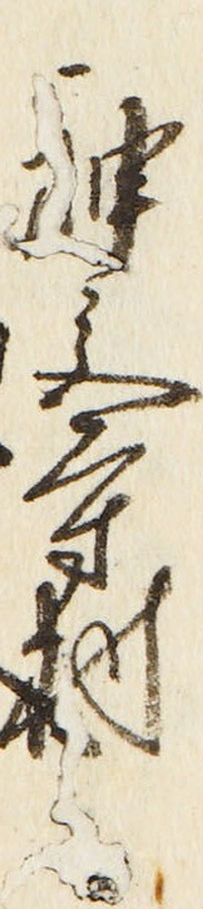神宮寺村
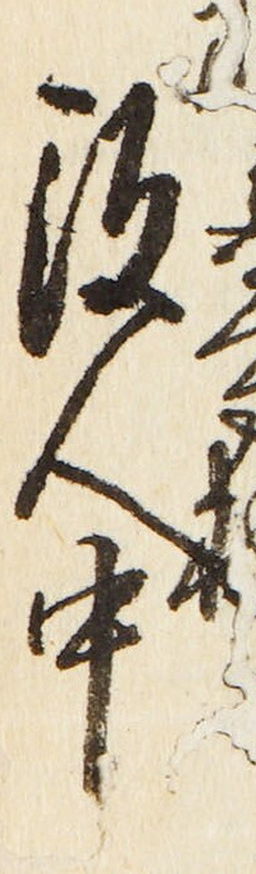役人中

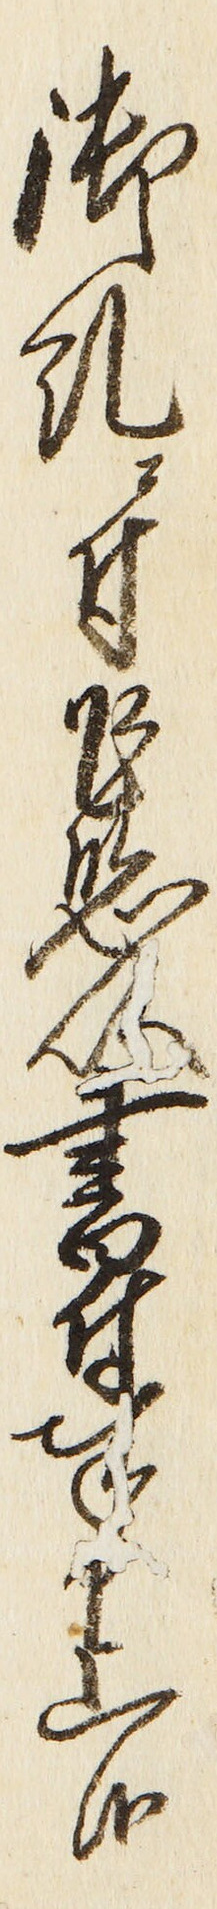御糺ニ付乍恐以書付奉申上候
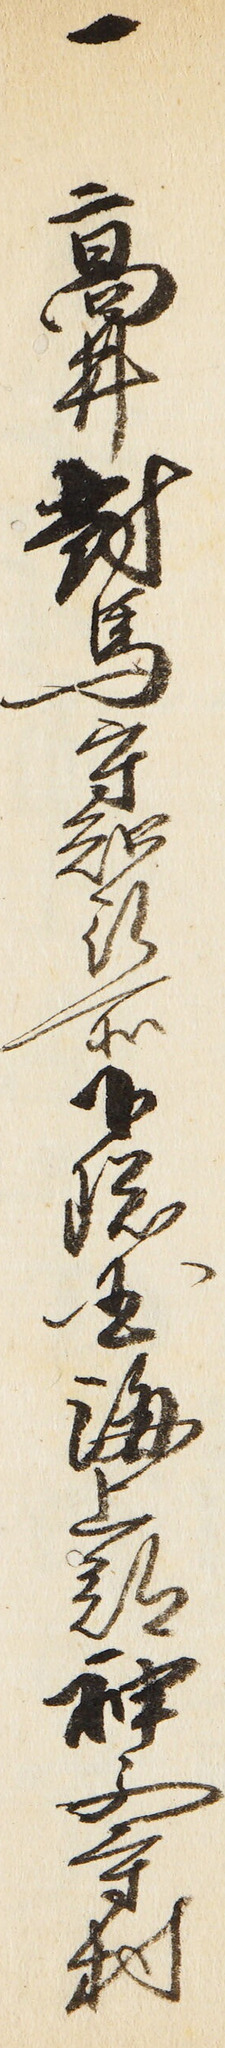一高井対馬守知行所下総国海上郡神宮寺村
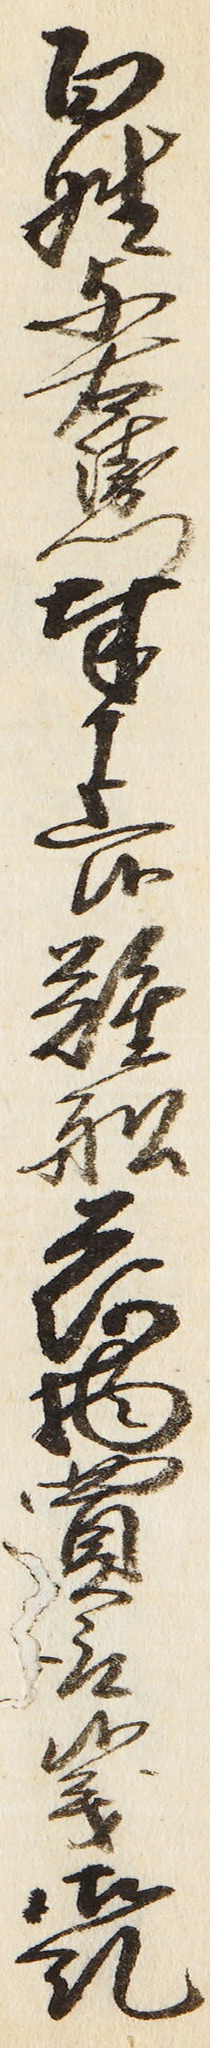百姓与右衛門奉申上候難船荷物買取候義御糺
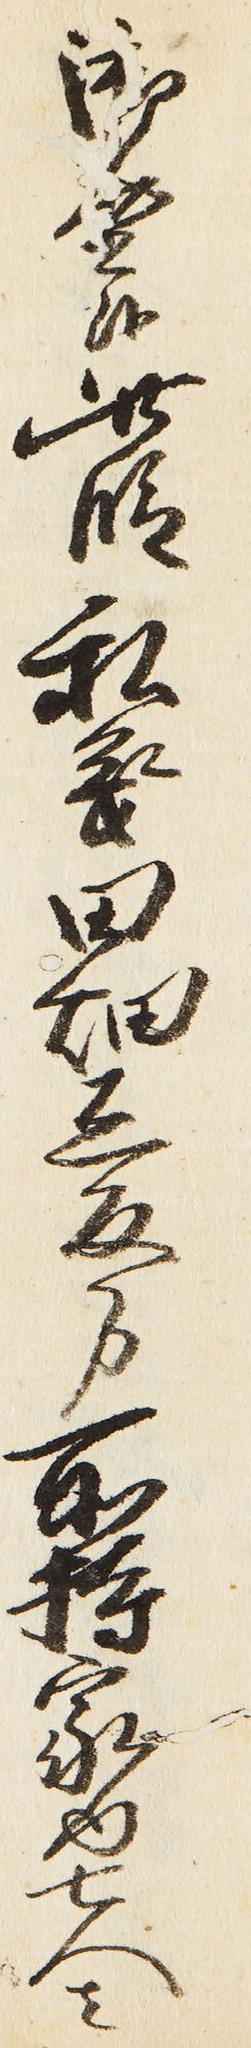御座候此段私義田畑三反方所持家内七人者
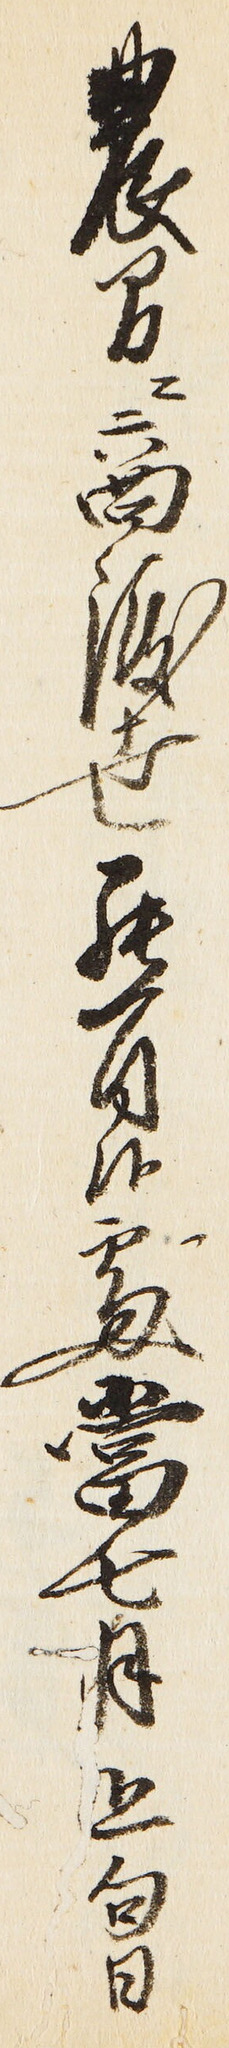農間ニ商渡世罷在候処当七月上旬日
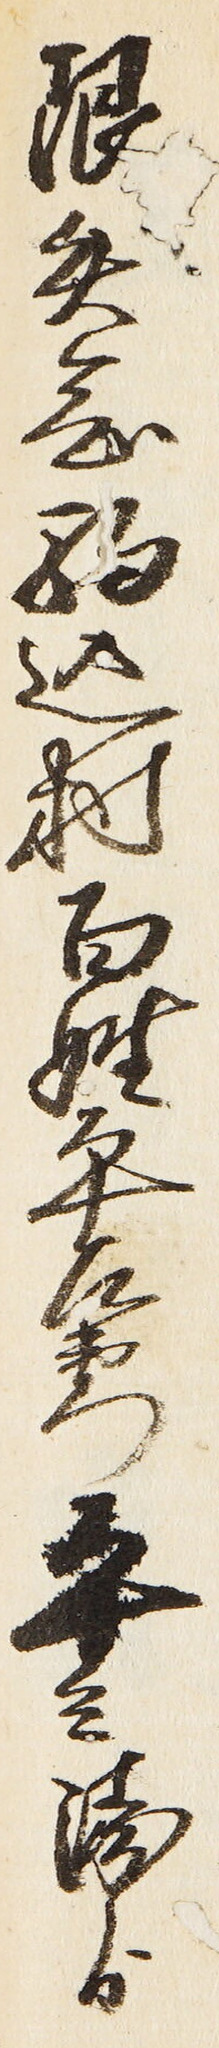限失念駒込村百姓平左衛門平兵衛ゟ
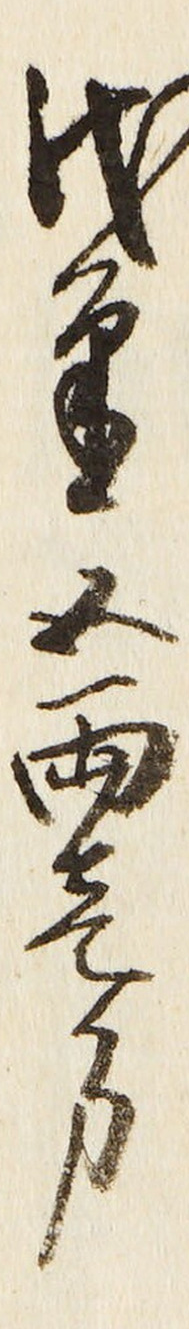代金五両壱分
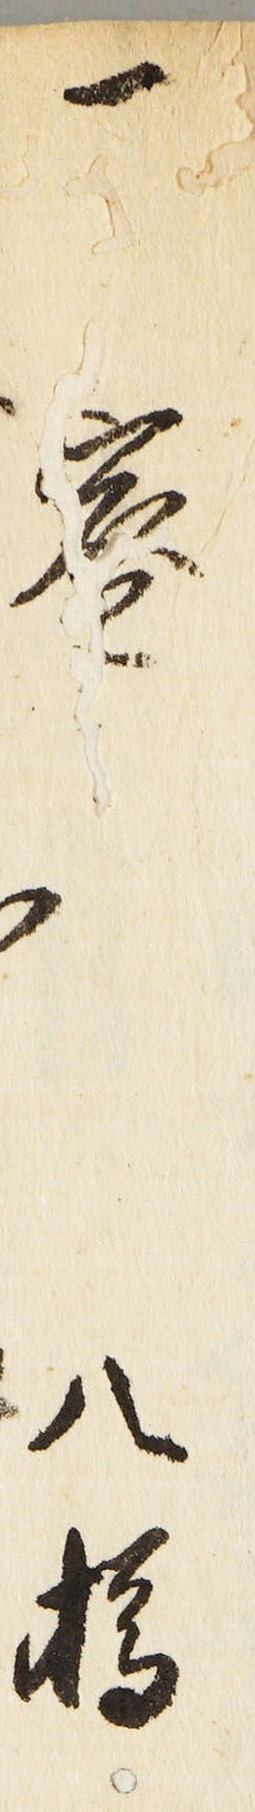一蜜八樽
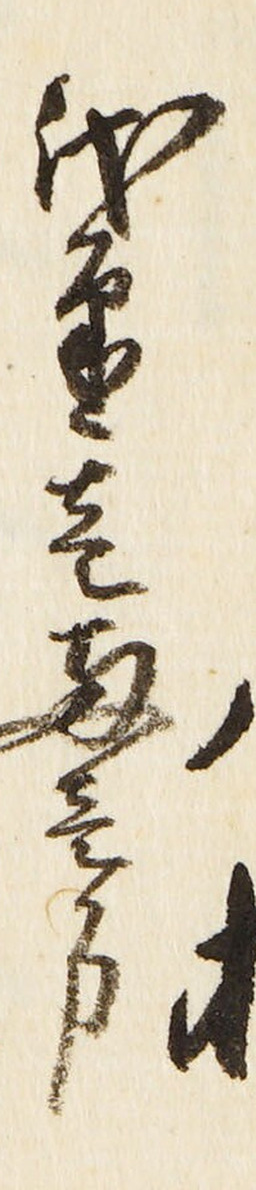代金壱両壱分
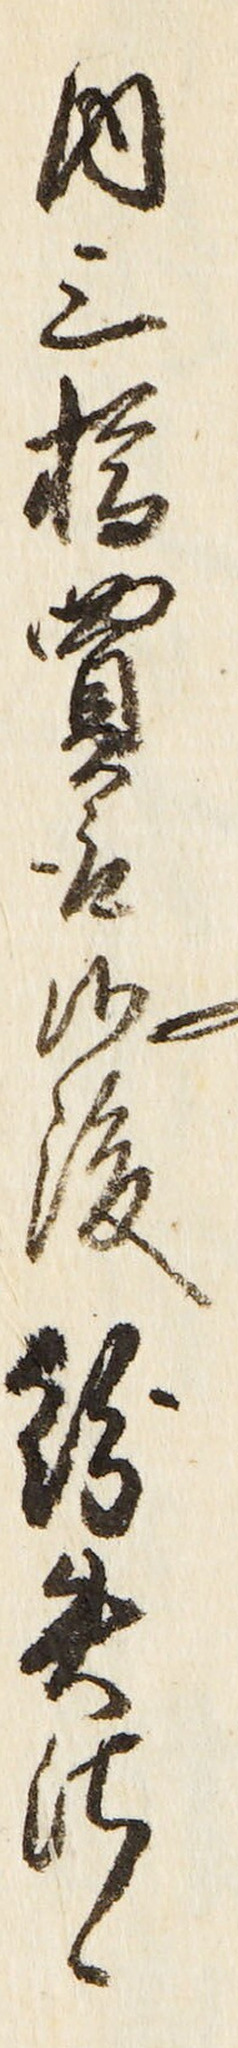内三樽買取候後紛失仕候
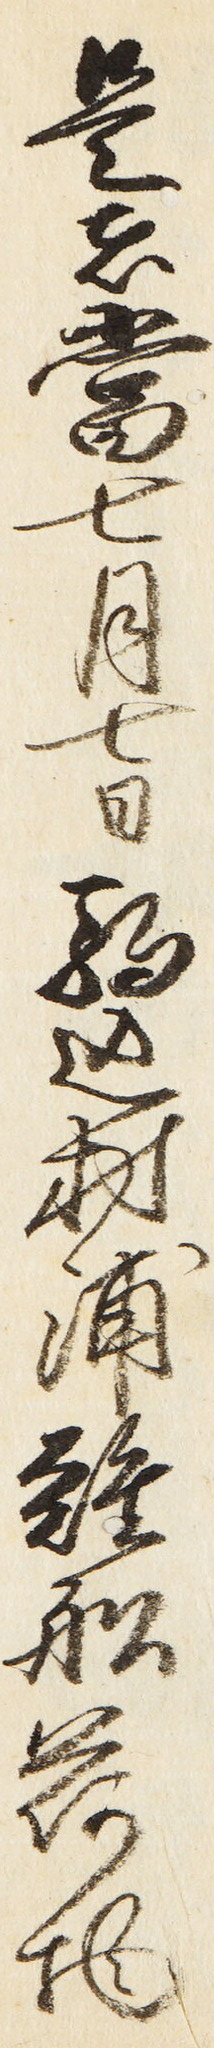是者当七月七日駒込村浦難船荷物
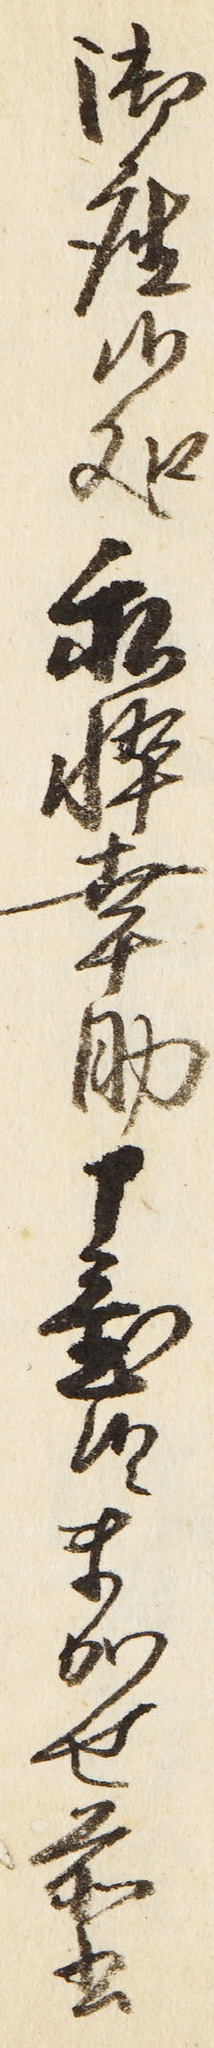御座候処私忰幸助申置候ニまかせ前書
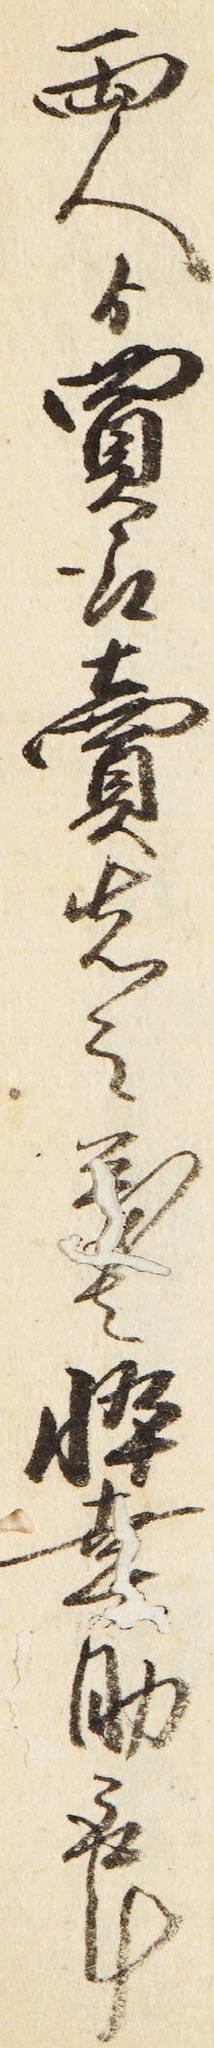両人ゟ買取売先之義者忰幸助取計

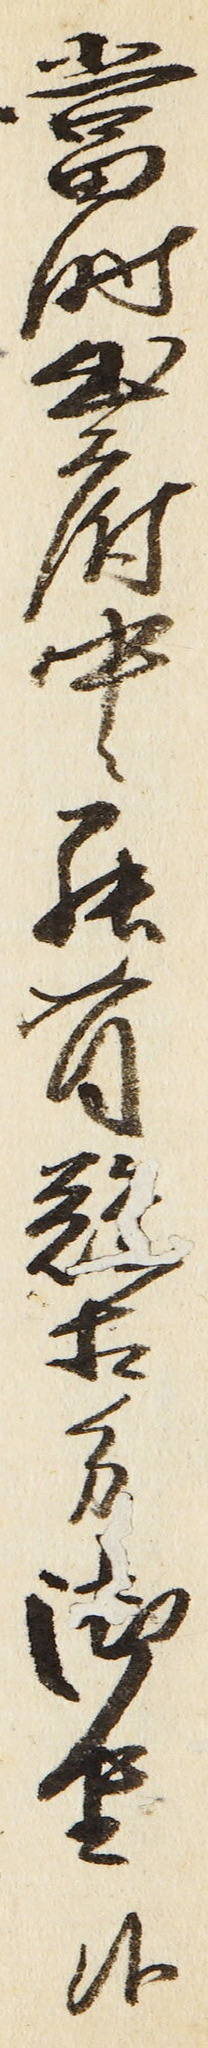当時出府中ニ罷有難相分御座候
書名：難船一件記録
